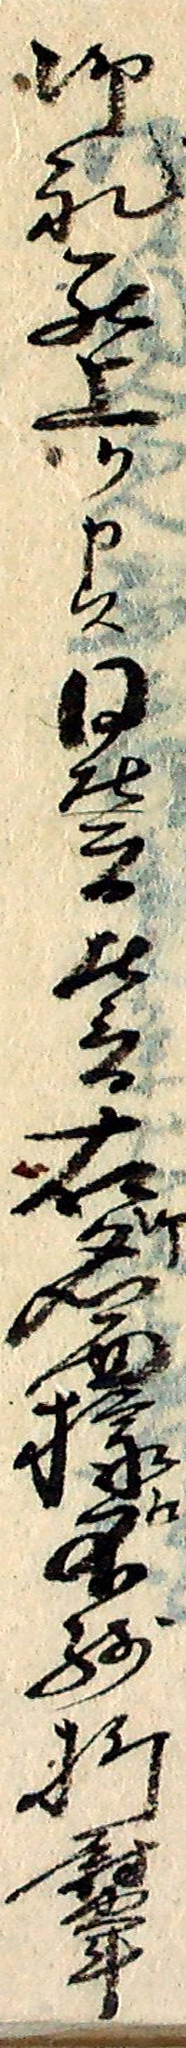御礼罷上り申候同廿二日廿三日右御名面様え不残折熨斗
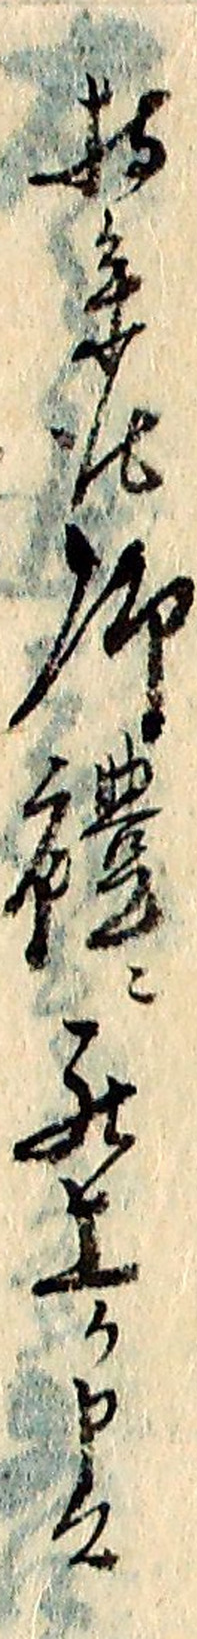持参仕御礼に罷上り申候
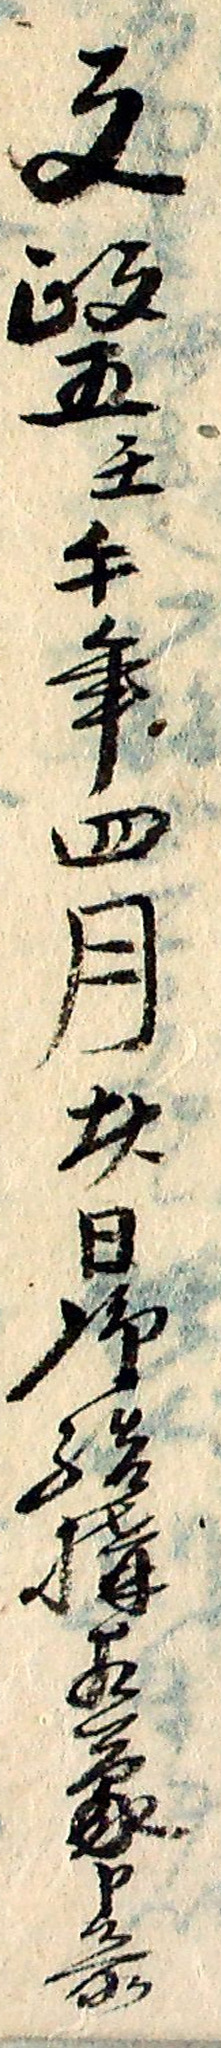文政五壬午年四月廿日御結構相蒙申候所
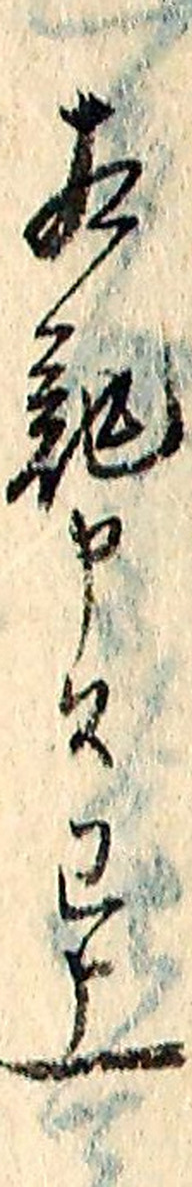相記申候已上

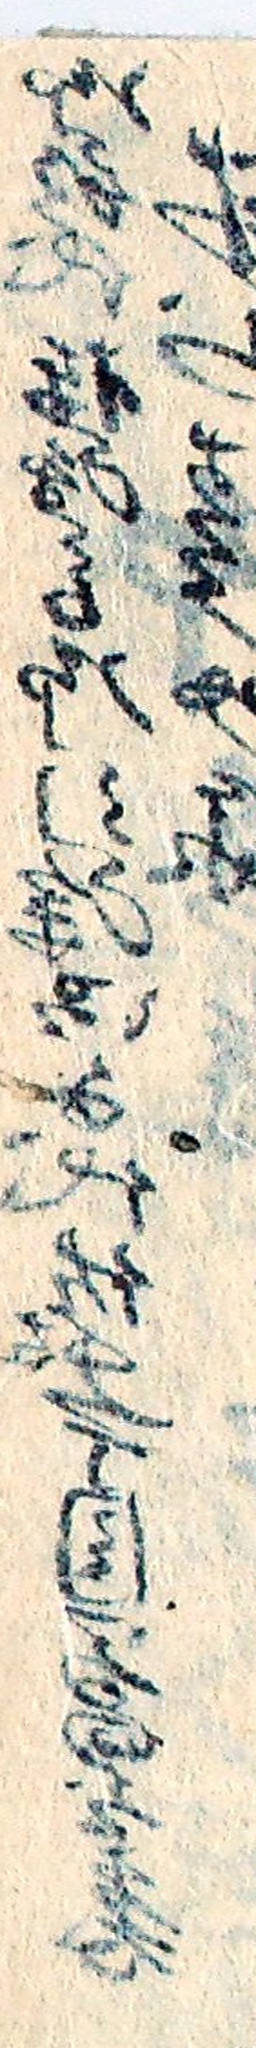五月十六日
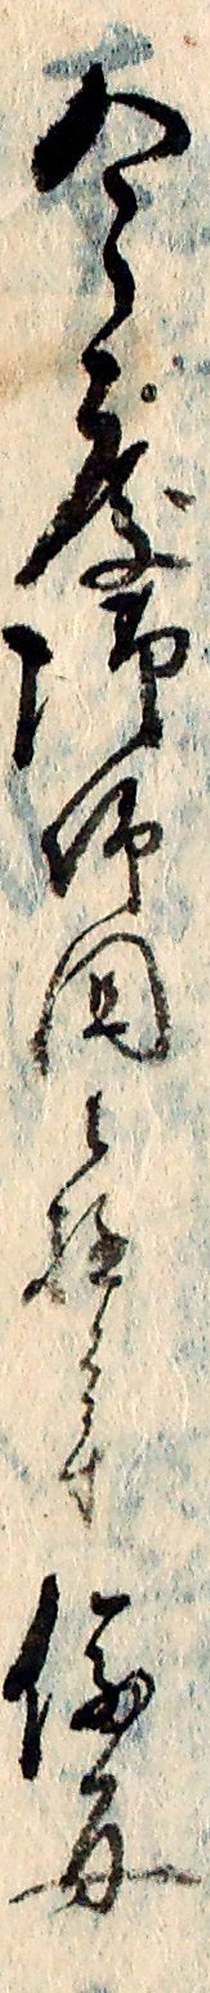今度御帰国被極候に付例毎
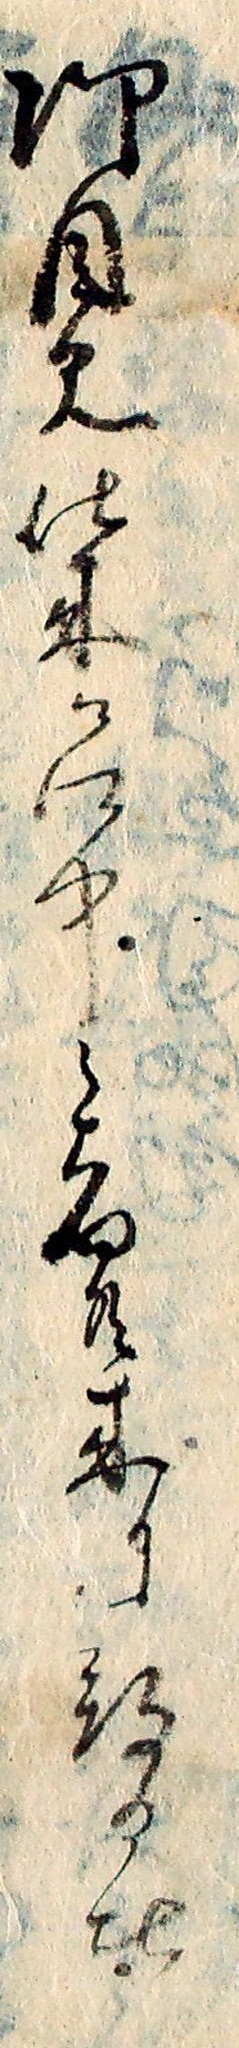御目見仕来候郷中之者共来月朔日比
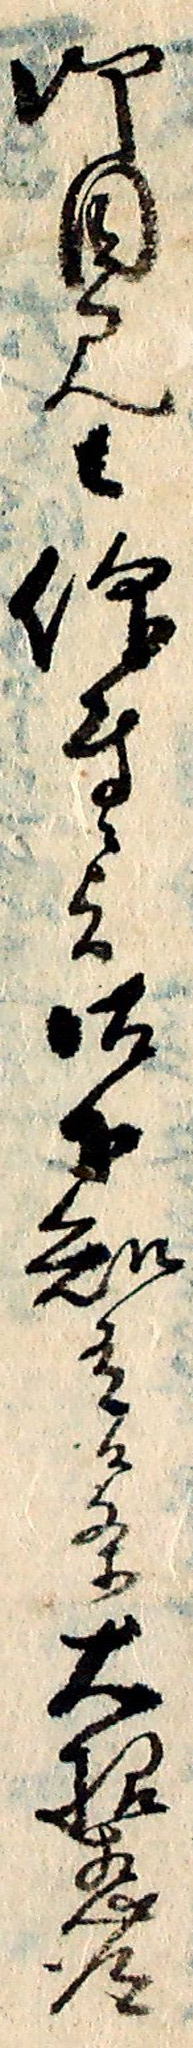御目見被仰付候旨御下知有候条右様相心得
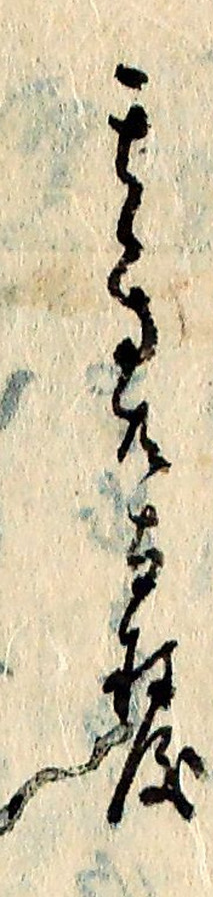其方共と村役
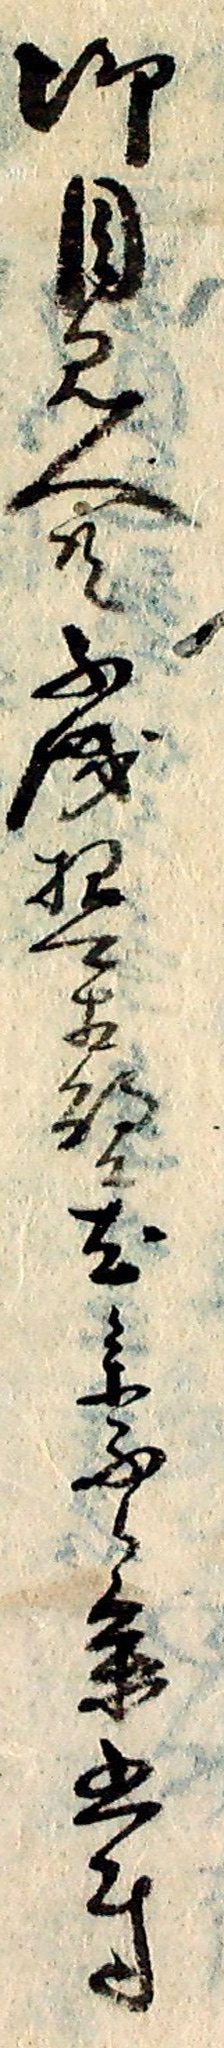御目見人共不洩様可相都候尤参不参書付
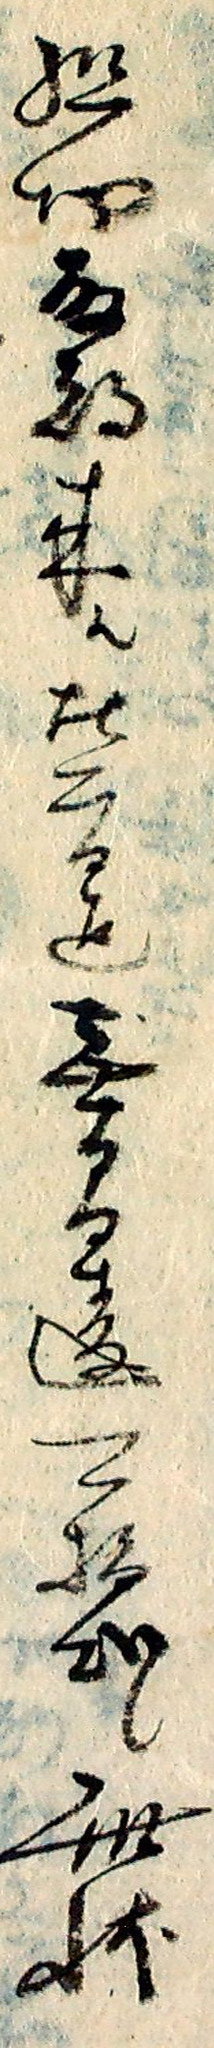組切取都来る廿二日迄無間違可指出候此状
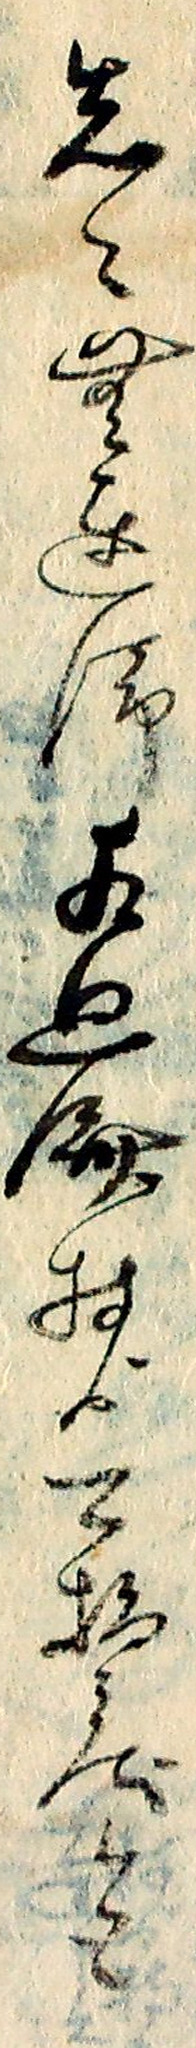先々無遅滞相廻済村ゟ可指戻候以上
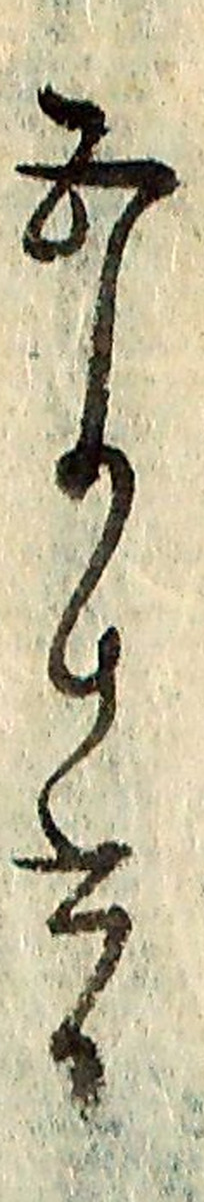五月十六日
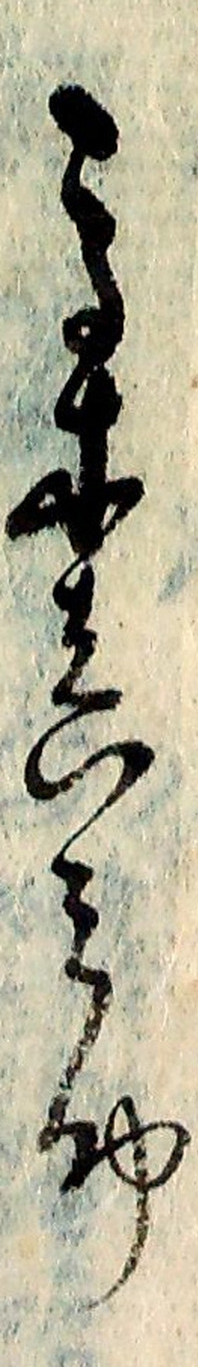高木真之助
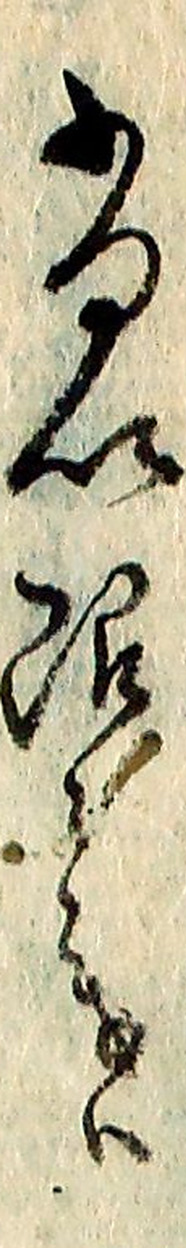尚以限之義は
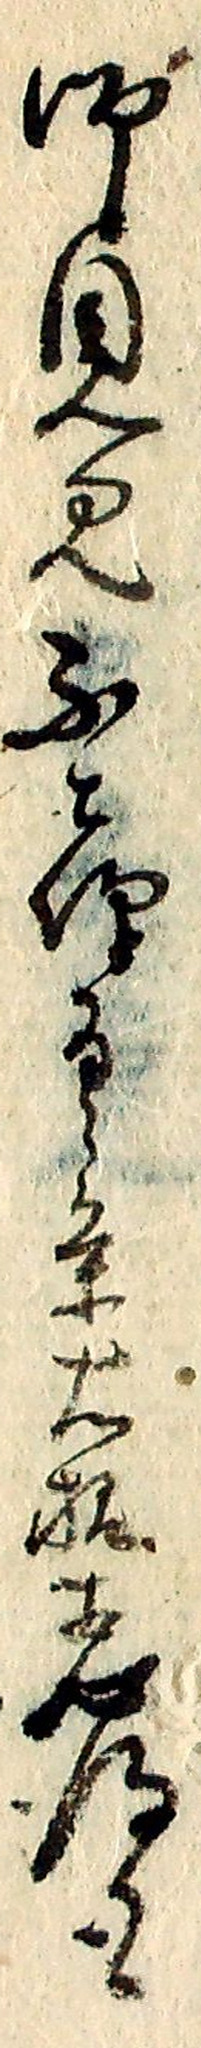御目見不被仰付候条右様相心得以上
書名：諸御願書控(後藤氏壱番）
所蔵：鳴門教育大学 Naruto University of Education
